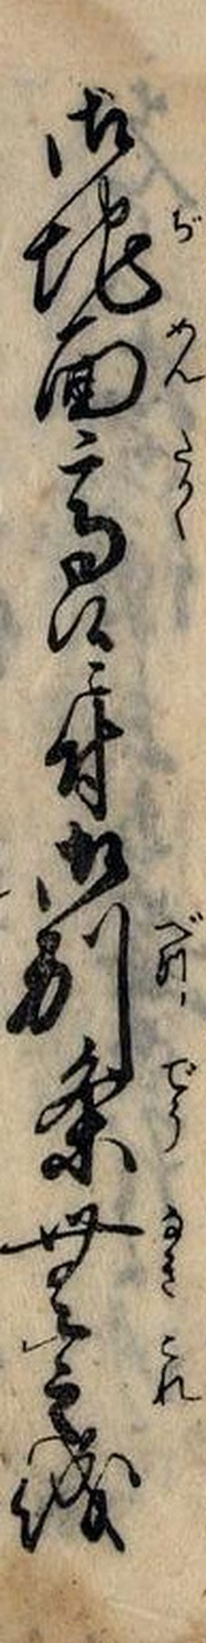御地面高候に付御別条無之儀
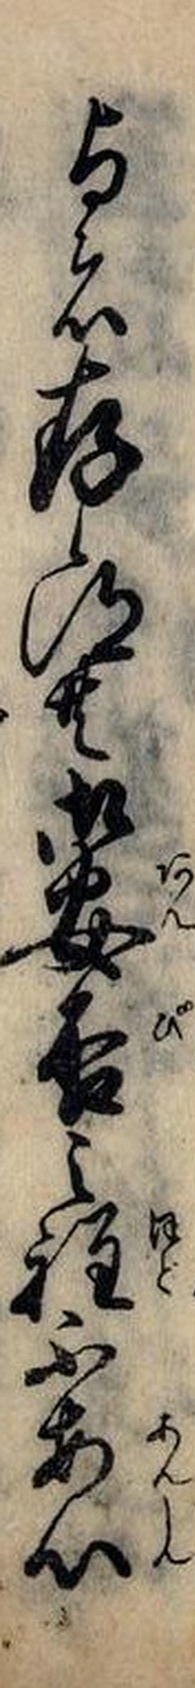与者存候得共御安否之程不安心
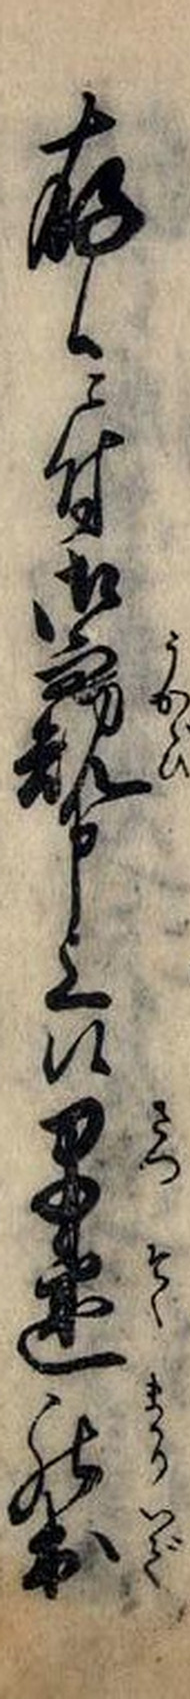存候に付御窺申上候早速罷出
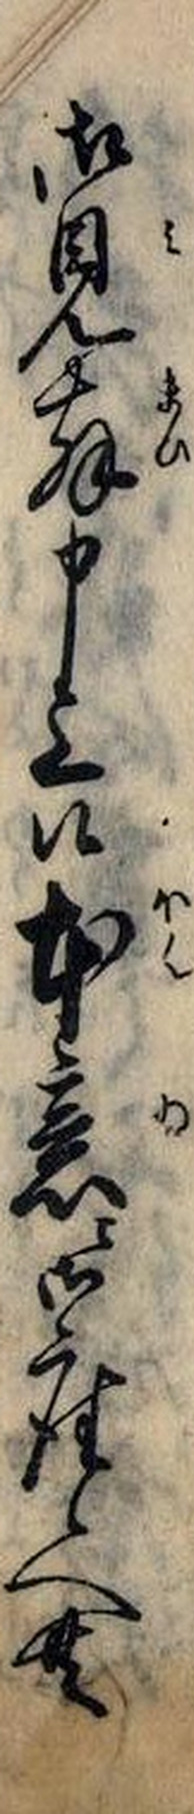御見舞申上候本意に御座候ヘ共

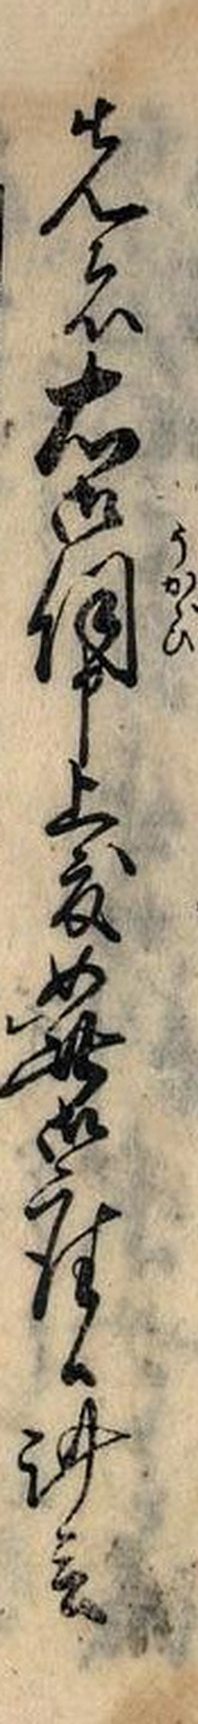先者右御伺申上度如此御座候謹言
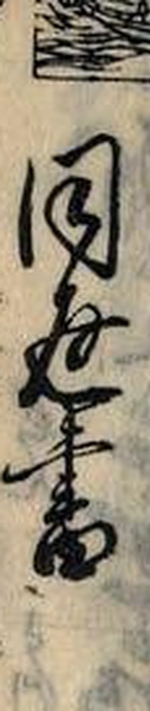同返書
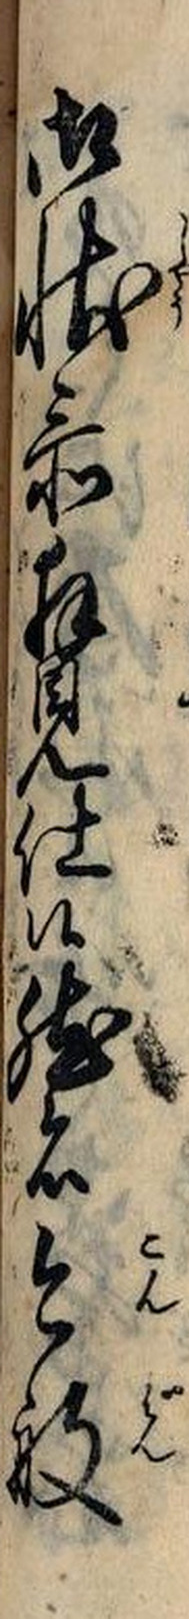御状忝拝見仕候然者今般
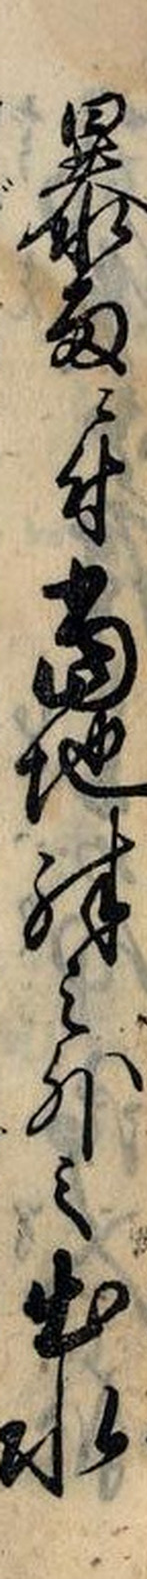暴雨に付当地殊之外之出水
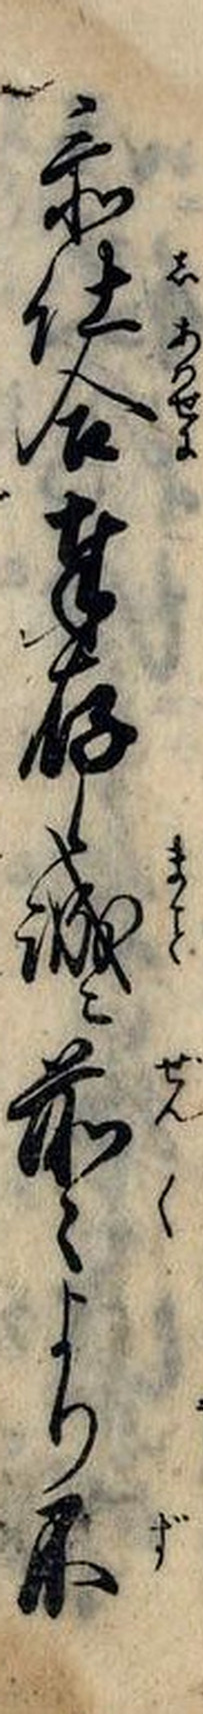忝仕合奉存候誠に前々より不
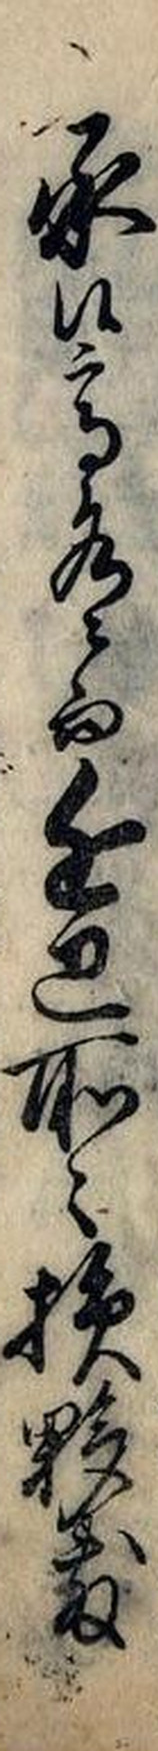承候高水に而近辺所々損夥敷
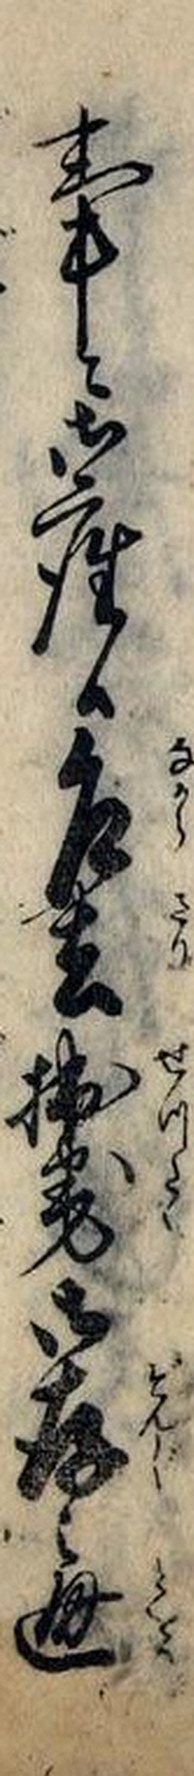事に御座候乍去拙宅御存之通
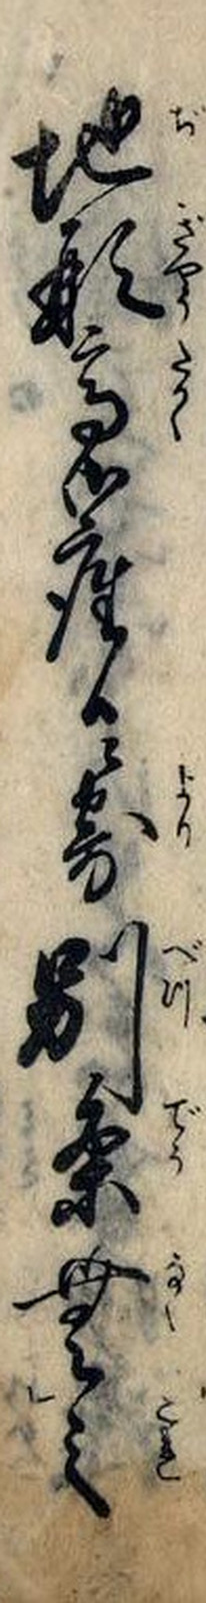地形高御座候に寄別条無之

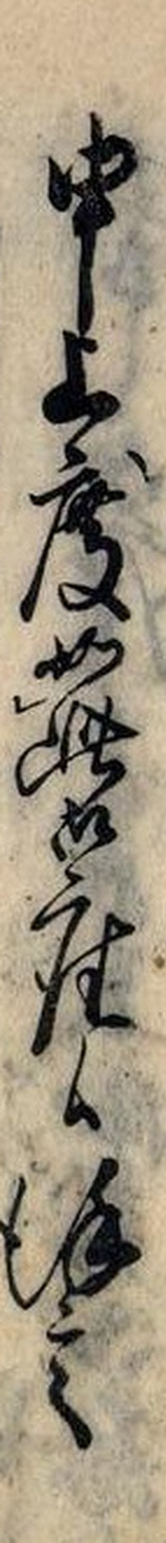申上度如此御座候謹言
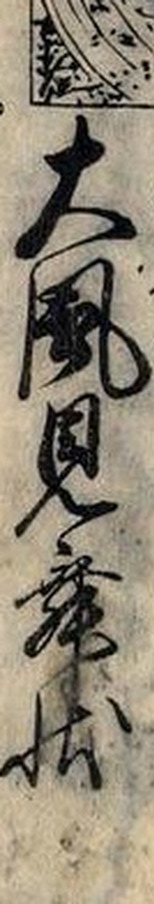大風見舞状
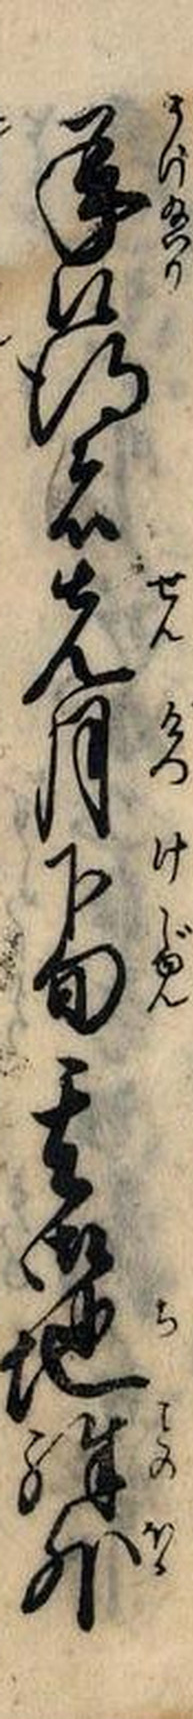承候得者先月下旬其御地殊外
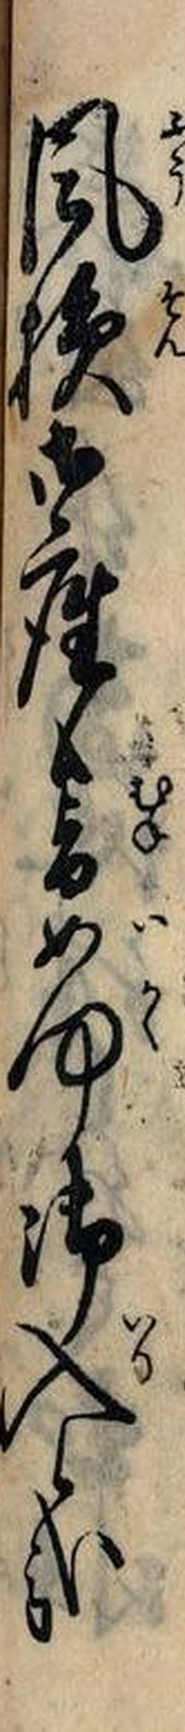風損御座候旨如何御入候哉
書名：大成用文章（往来物）
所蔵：福井県文書館 Fukui Prefectural Archives
